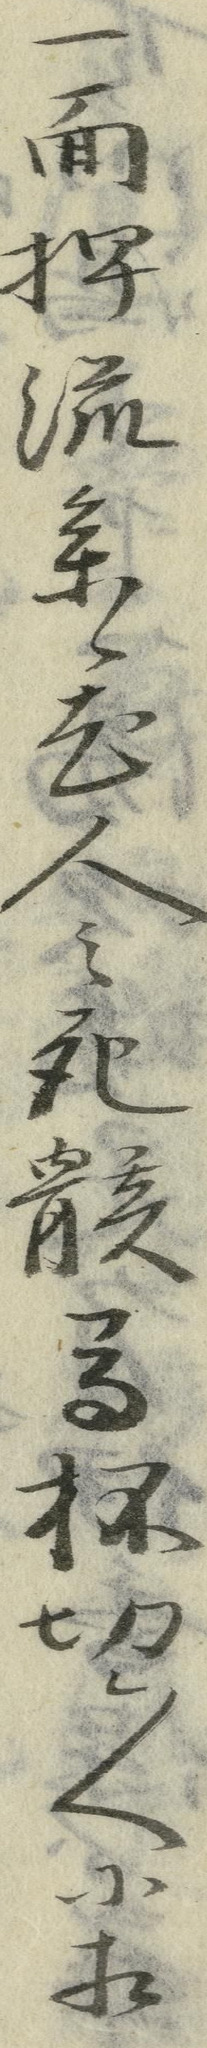一面押流参候尤人之死骸馬抔切レ〳〵に相
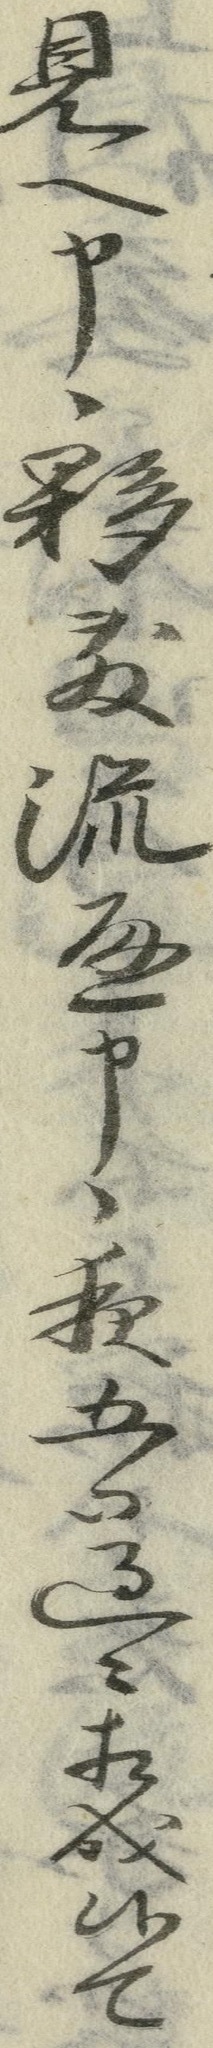見ヘ申候夥敷流通申候夜五ツ過ニ相成候て
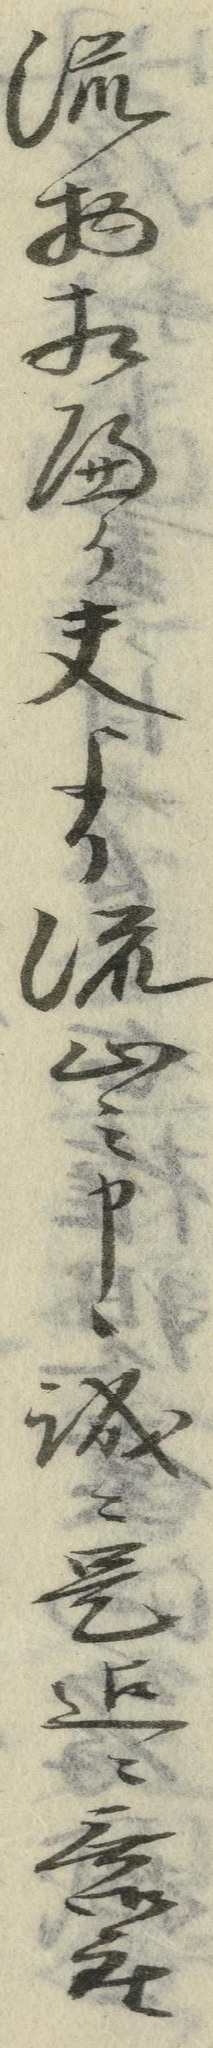流物相へリ夫より流れ止み申候誠ニ是迄ニ無御座
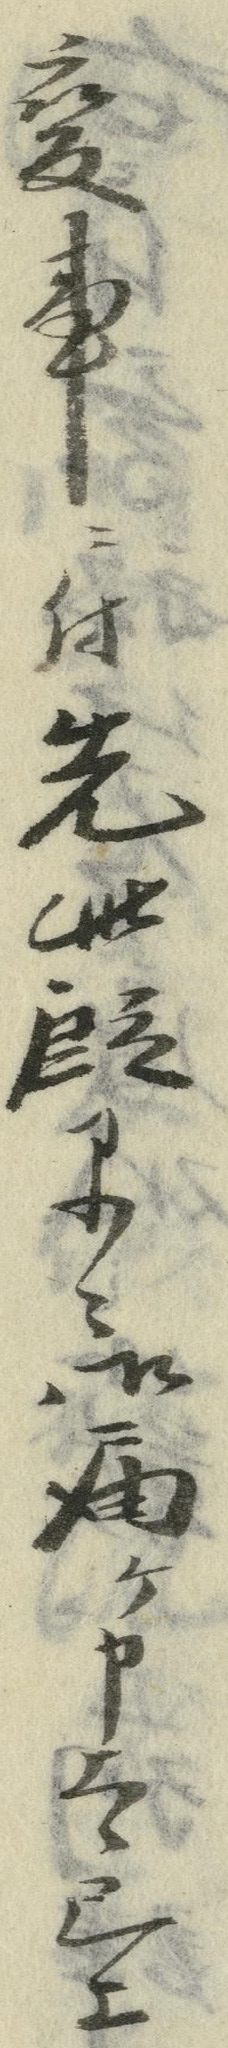変事ニ付先此段早々御届ケ申上候已上
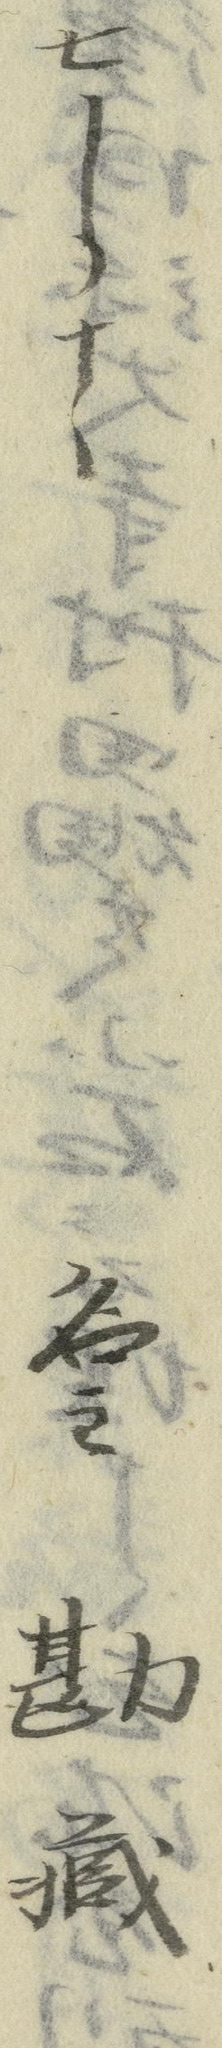七月十日名主勘蔵
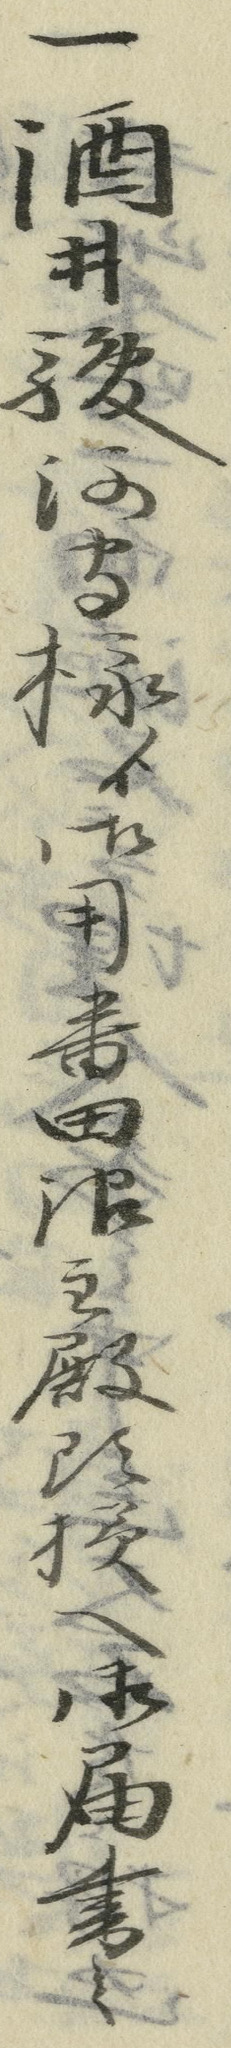一酒井駿河守様ゟ御用番田沼主殿頭様ヘ御届書之
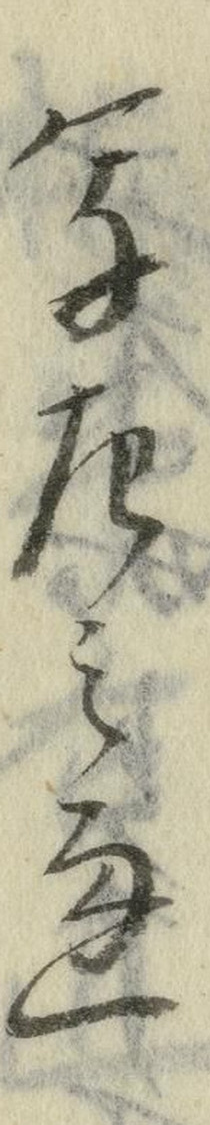写左之通
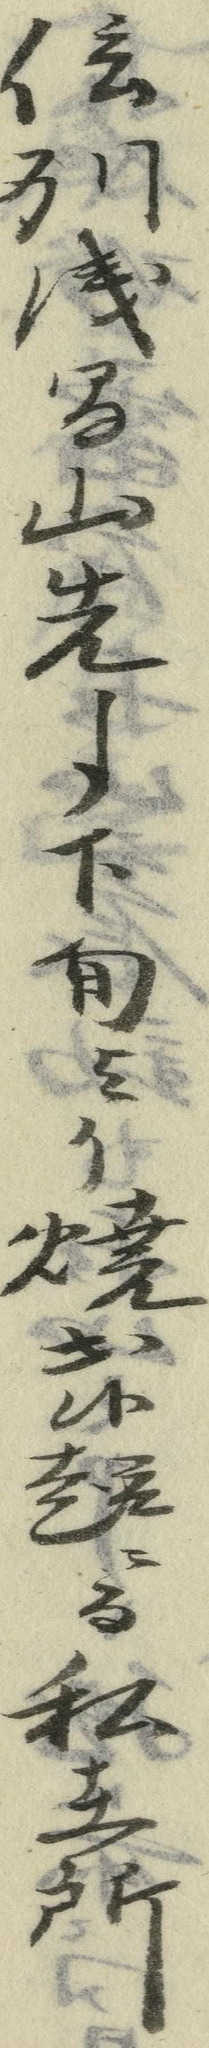信州浅間山先月下旬より焼出候趣ニ而私在所
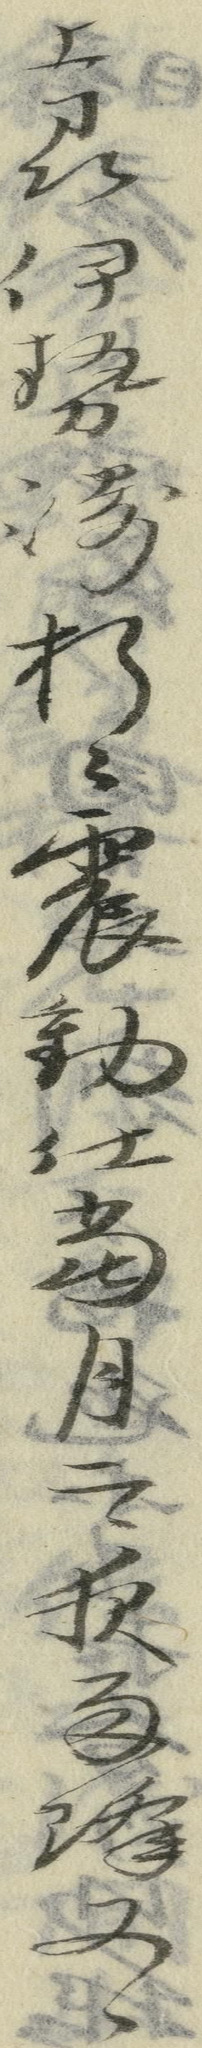上州伊勢崎折々震動仕当月二日夜雨降又ゝ
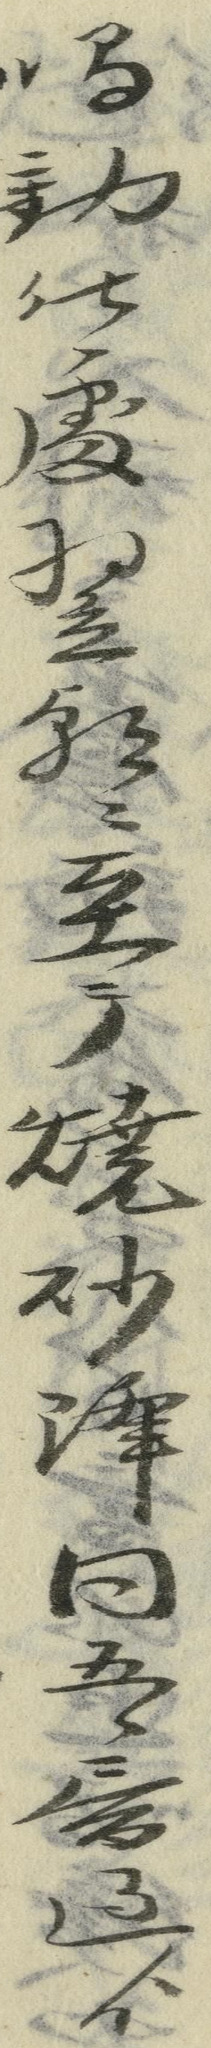鳴動仕候処翌朝ニ至テ焼砂降同五日昼過ゟ
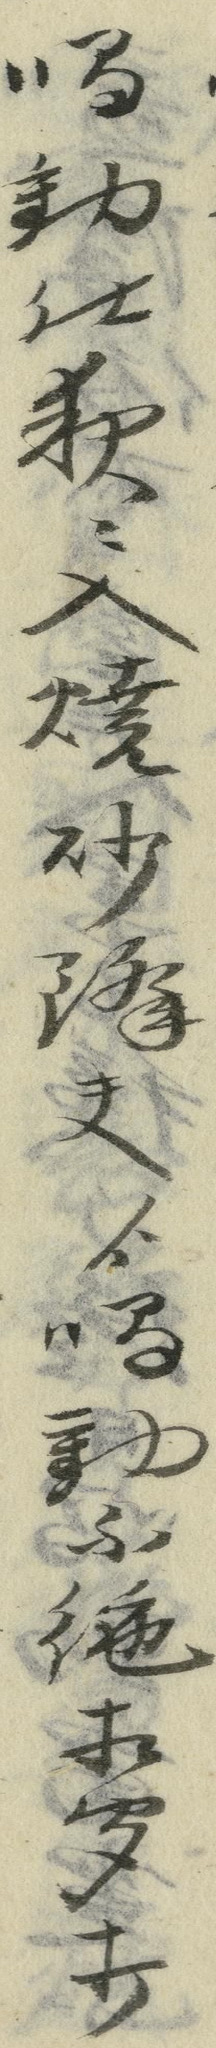鳴動仕夜ニ入焼砂降夫ゟ鳴動不絶相聞打
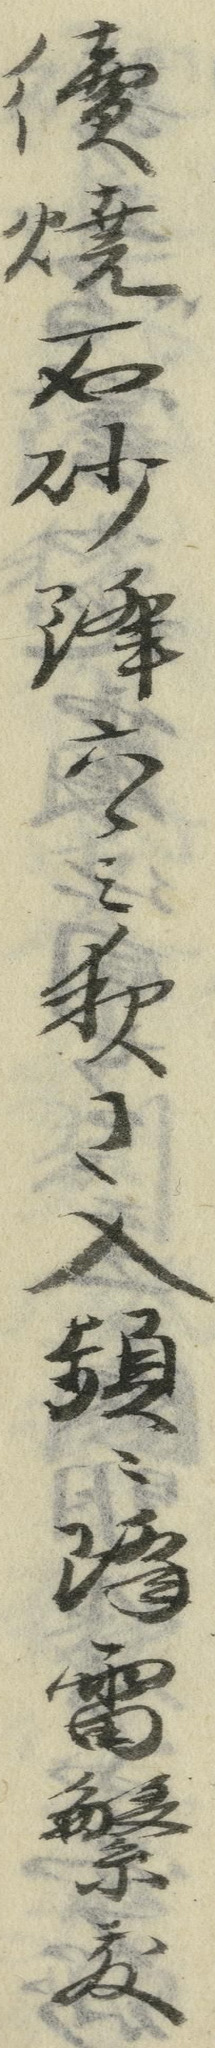続焼石砂降六日之夜に入頻ニ降雷繁敷

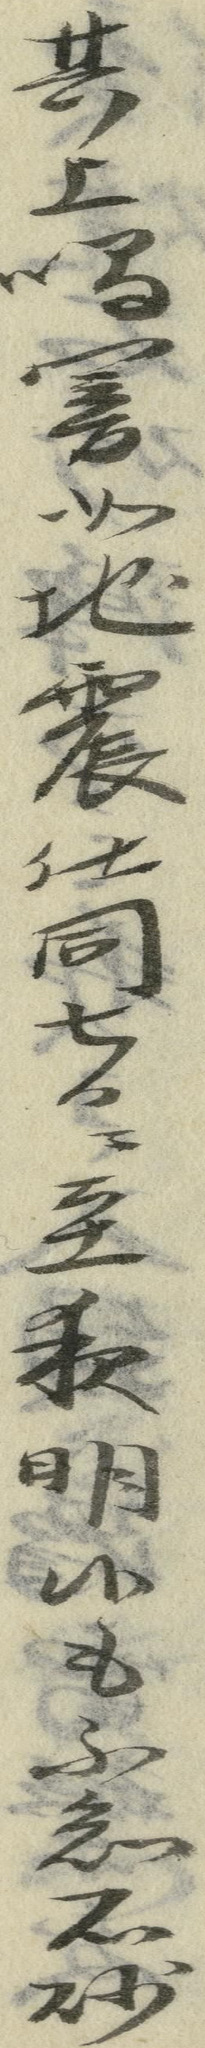其上鳴響如地震仕同七日ニ至夜明候も不知石砂
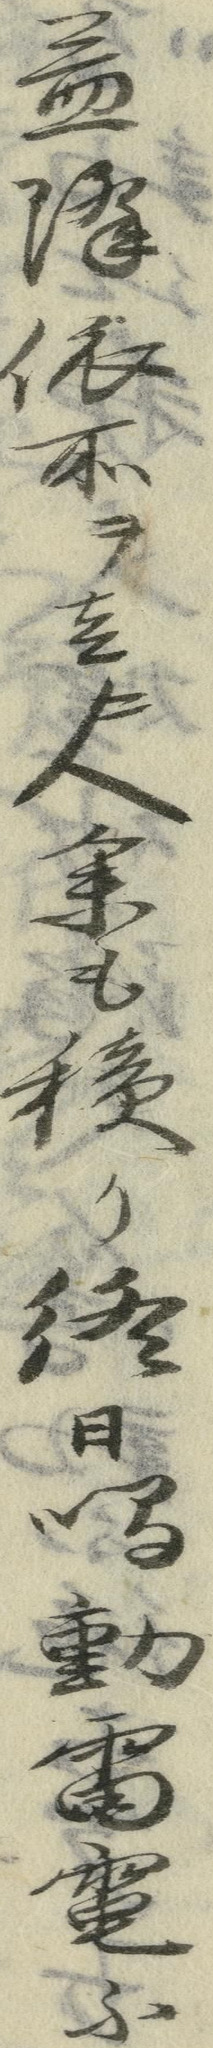益降依所ヲ壱尺余も積り終日鳴動雷電不
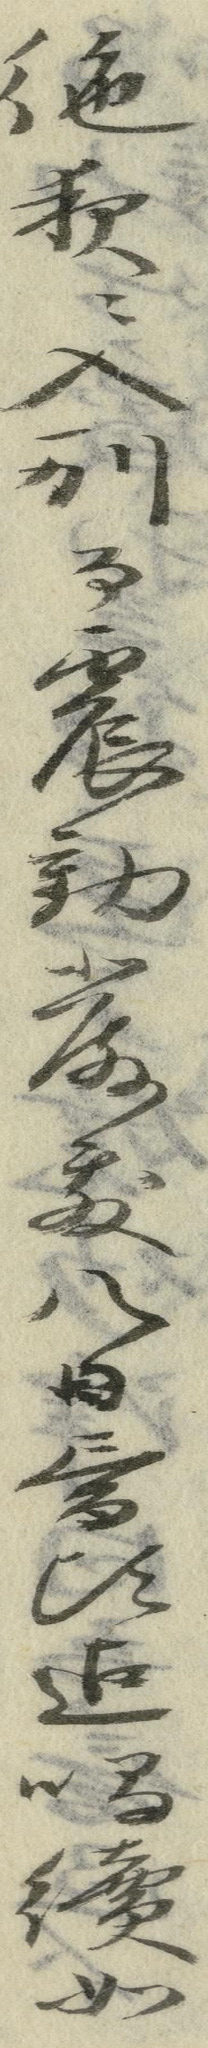絶夜ニ入別而震動厳敷八日昼頃迄鳴続如
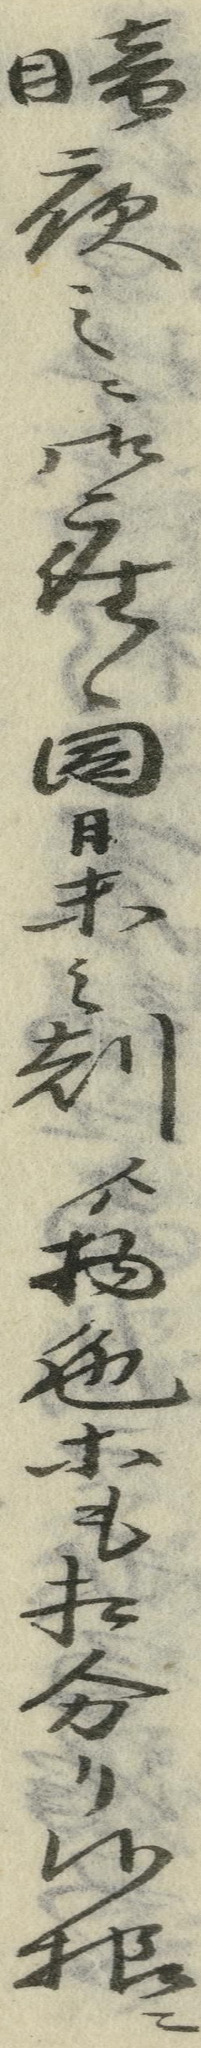暗夜之ニ御座候同日未之刻ゟ物色等も相分り候様ニ
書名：天明三癸卯七月信州浅間山焼出シ上州山津浪ニ付近國ヨリ御届書并訴書写
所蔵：東京大学地震研究所図書室 Earthquake Research Institute Library, The University of Tokyo, JAPAN
